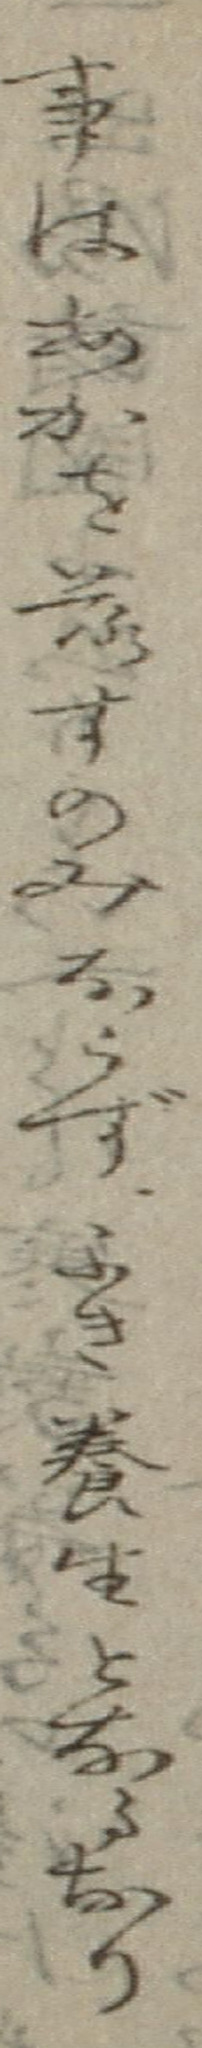事はあかを落すのみならず、よき養生となるなり
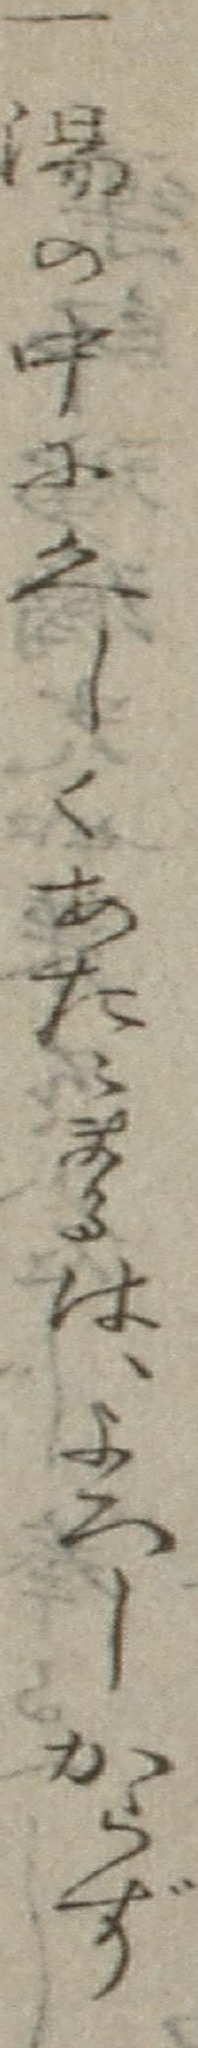一湯の中に久しくあたゝまるは、よろしからず
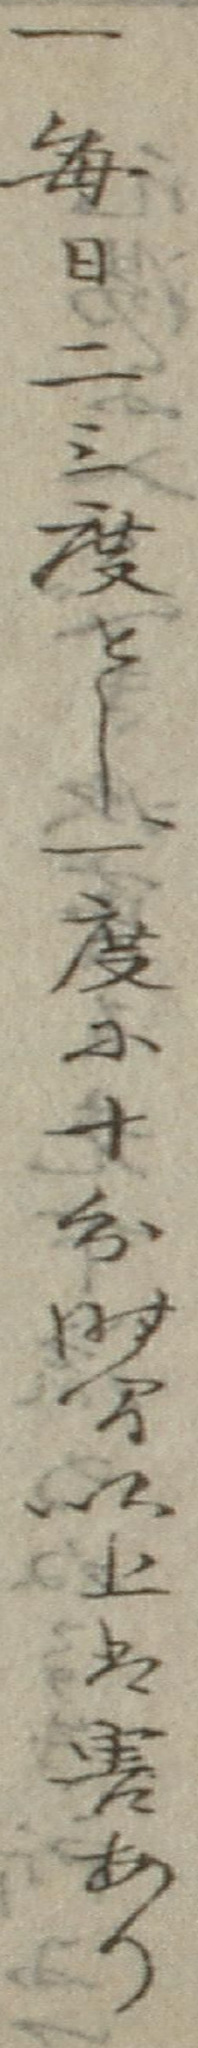一毎日二三度とし、一度に十分時間以上は害あり
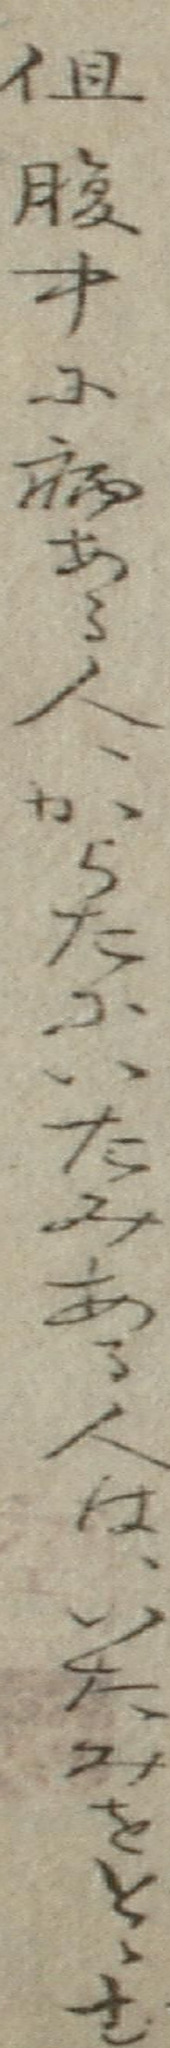但腹中に病ある人、からたにいたみある人は、いたみをとゝむ
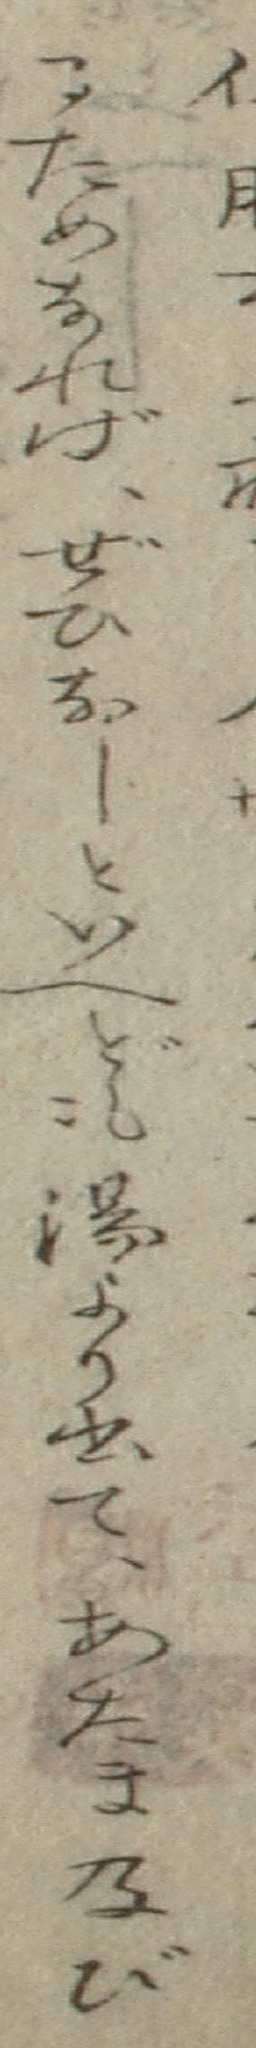るためなれば、ぜひなしといへども湯より出て、あたま及び
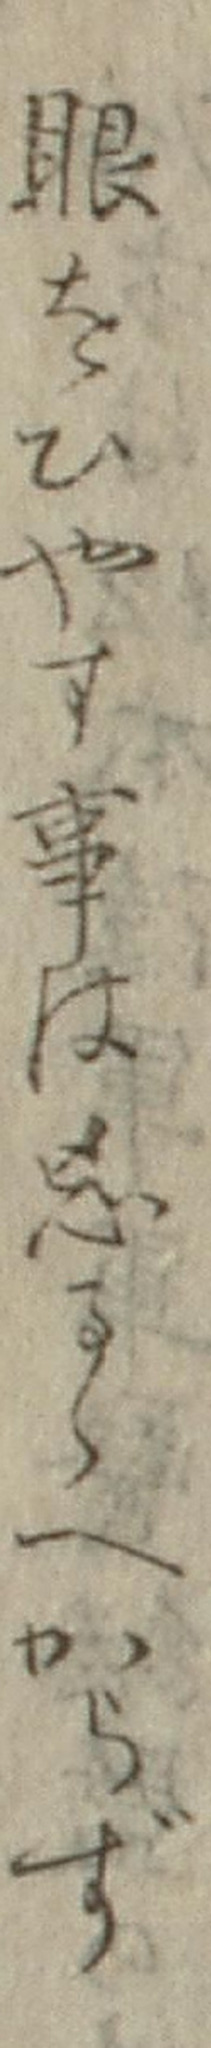眼をひやす事は忘るゝへからず
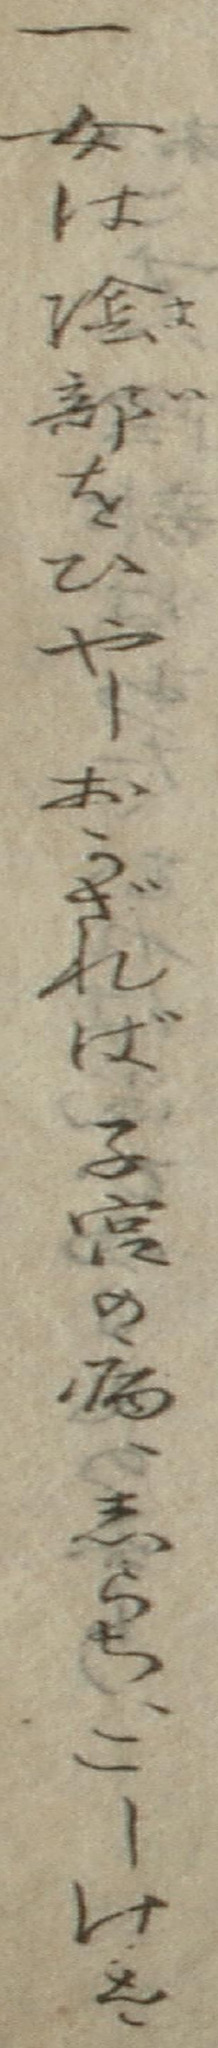一女は陰部をひやしおかざれば子宮の病、しらち、こしけを

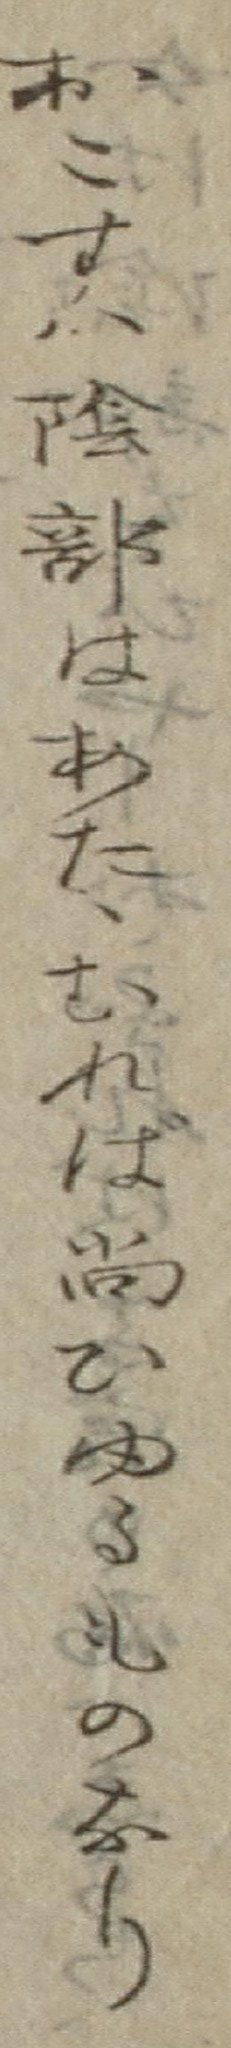おこすは陰部はあたゝむれば尚ひゆるものなり
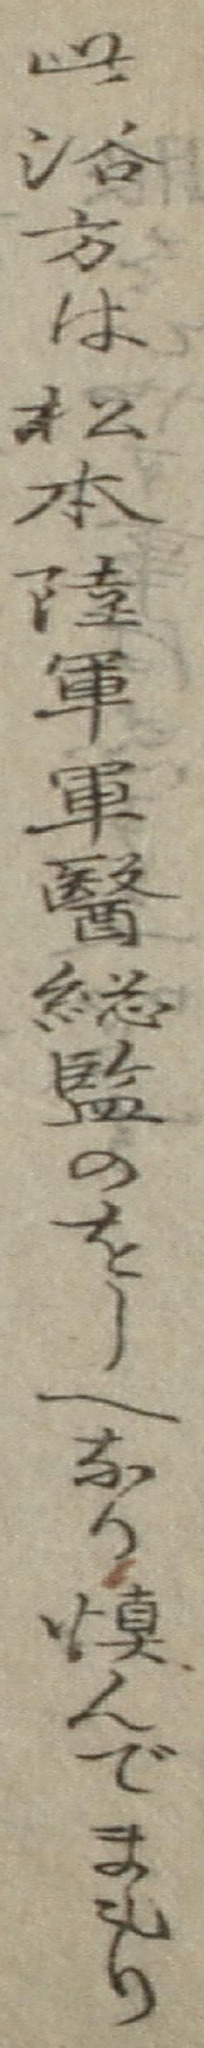此浴方は松本陸軍軍医総監のをしへなり慎んでまもり
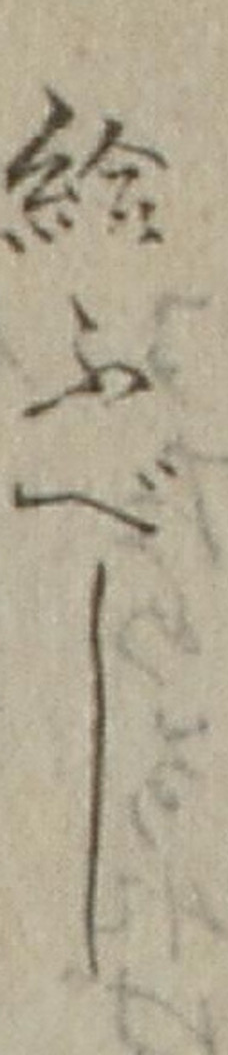給ふべし
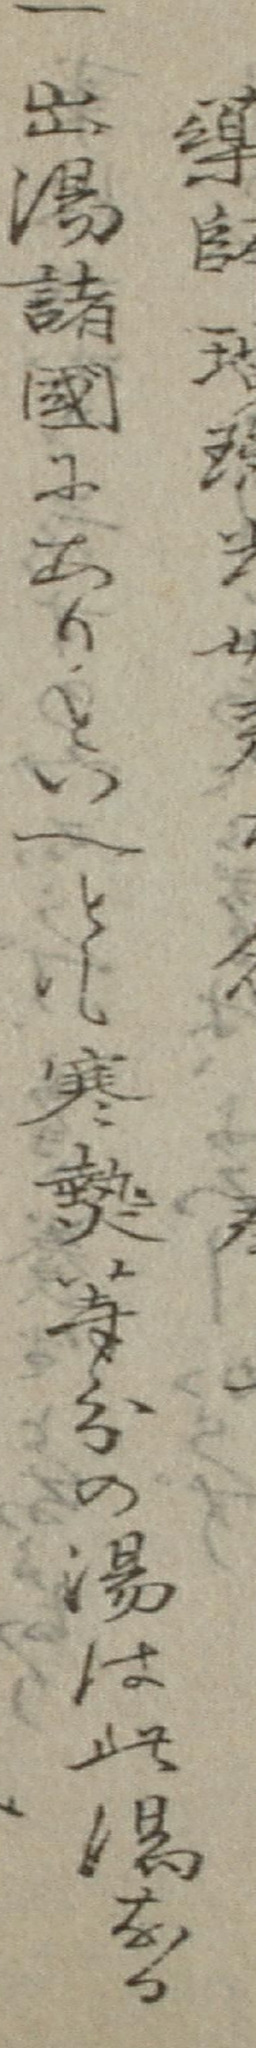一出湯諸国にありといへとも寒熱等分の湯は此湯なる
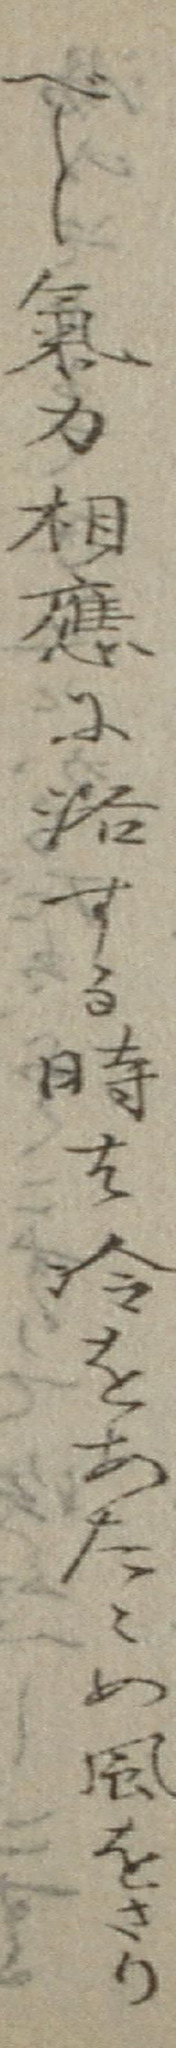べし気力相応に浴する時は冷をあたゝめ風をさり
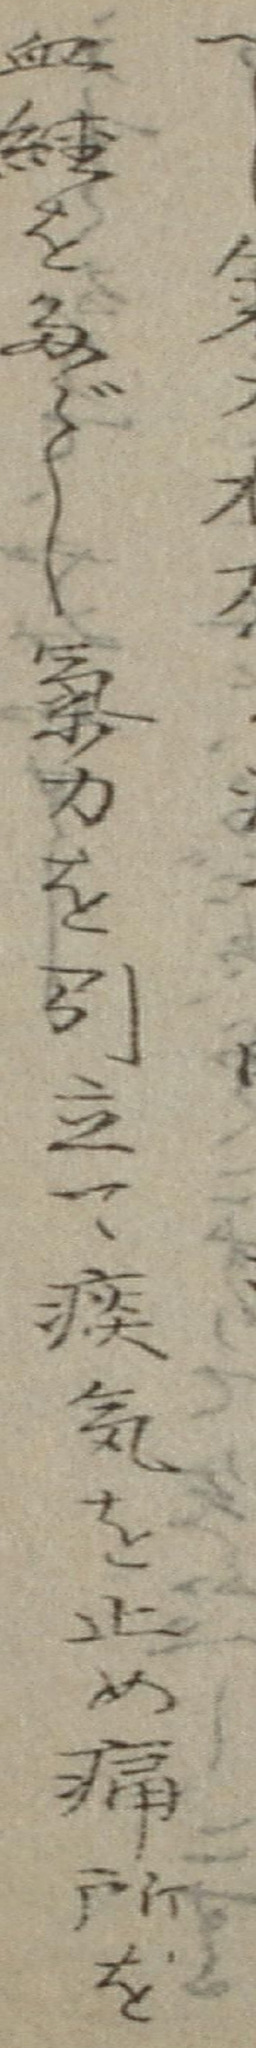血経をたゞし気力を引立て痰気を止め痛所を
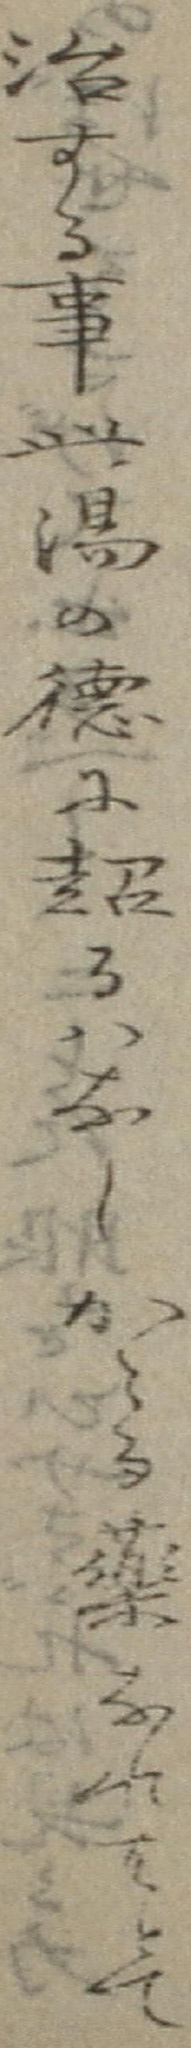治する事此湯の徳に超るはなしかゝる薬なれはとて
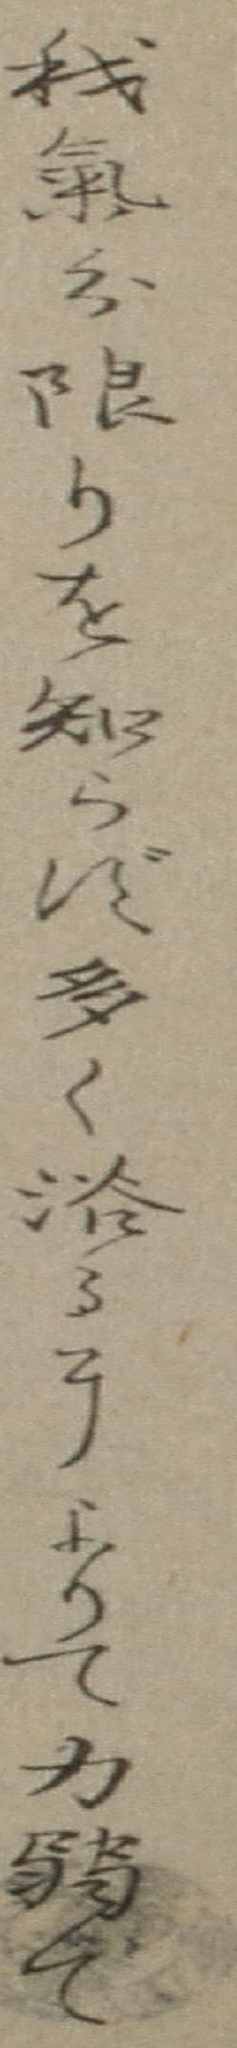我気分限りを知らず多く浴るによりて力弱て
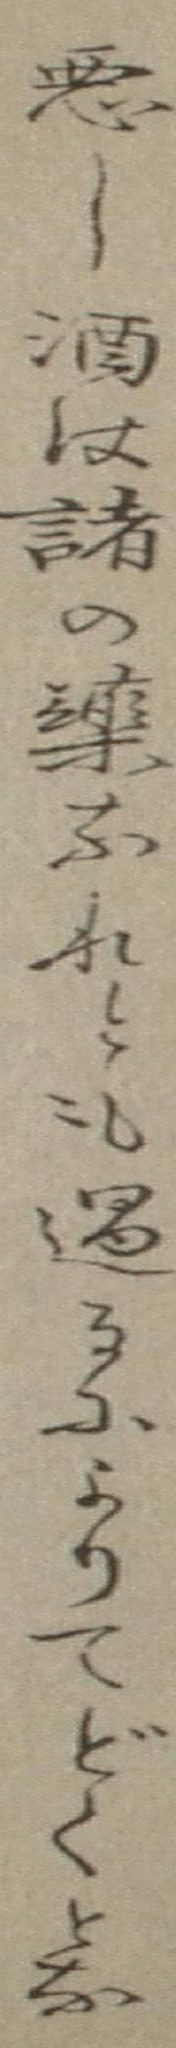悪し酒は諸の薬なれとも過るによりてどくとな
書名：山中温泉縁記并ニ入浴之心得
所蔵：東京大学地震研究所図書室 Earthquake Research Institute Library, The University of Tokyo, JAPAN
